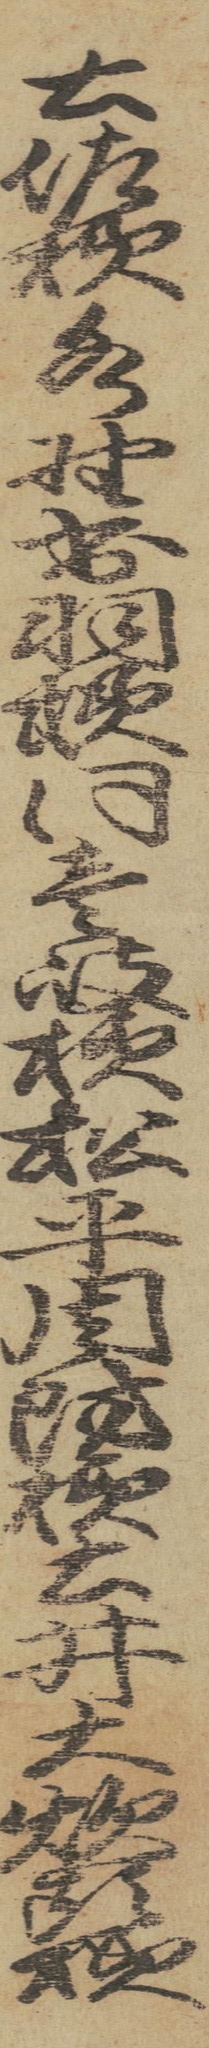土佐様水野出羽様同壱岐様松平周防様土井大炊頭様
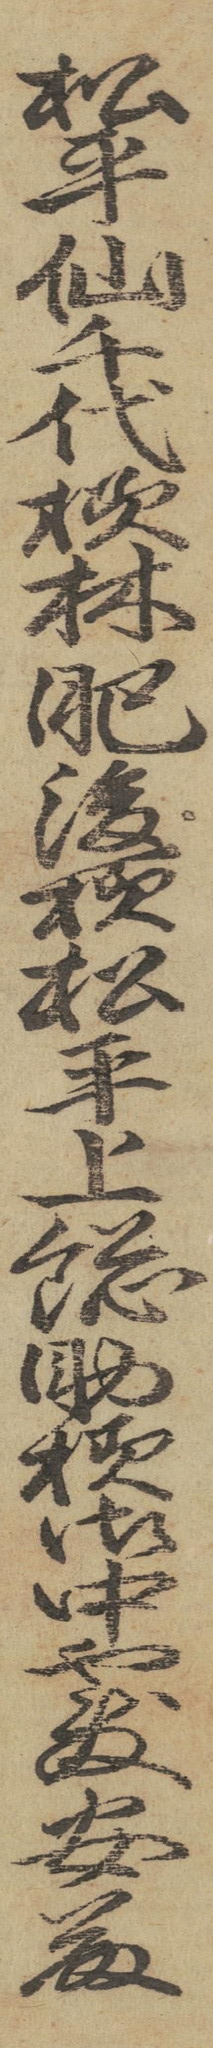松平仙千代様林肥後様松平上総助様御中や敷安藤
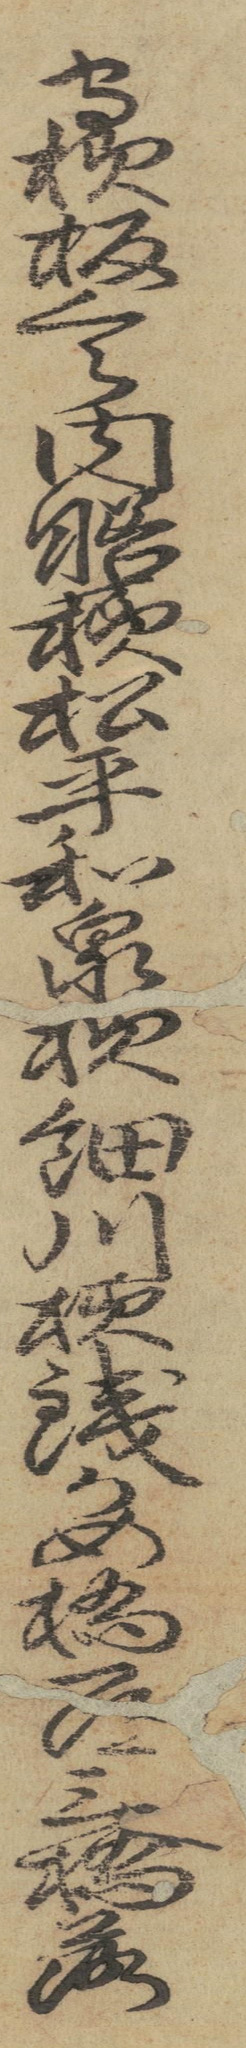守様板くら内膳様松平泉様細川様銭かめ橋道三橋落
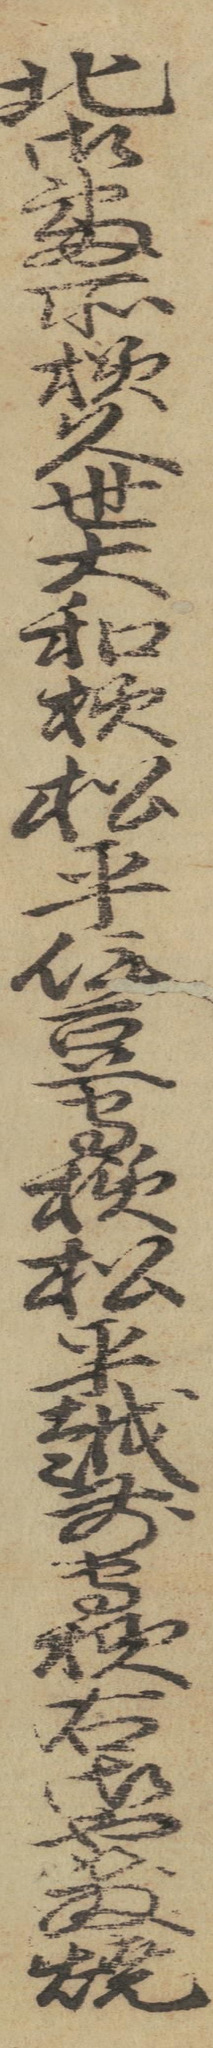北御番所様久世大和様松平伊豆守様松平越前守様右御や敷焼
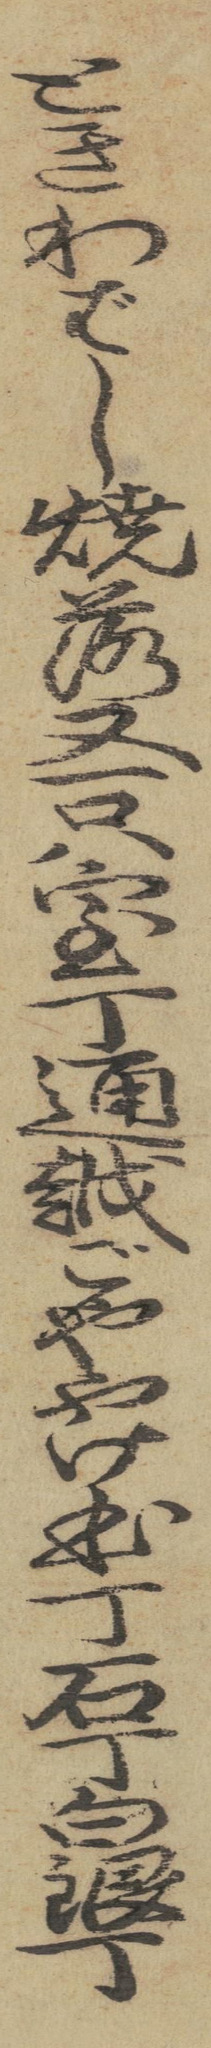ときわばし焼落又一口ハ宝丁通越ごややけ本丁石丁白金丁
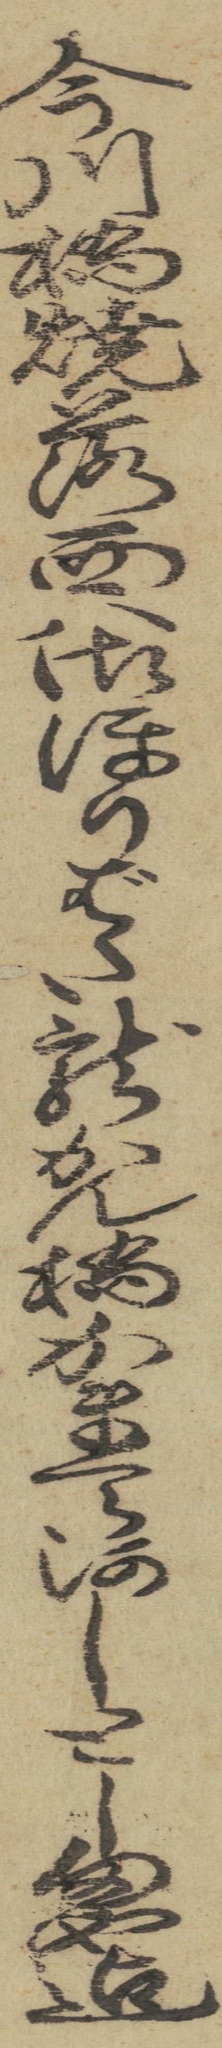今川橋焼落西へ御ほりばた龍かん橋かまくら河しとしまや迄
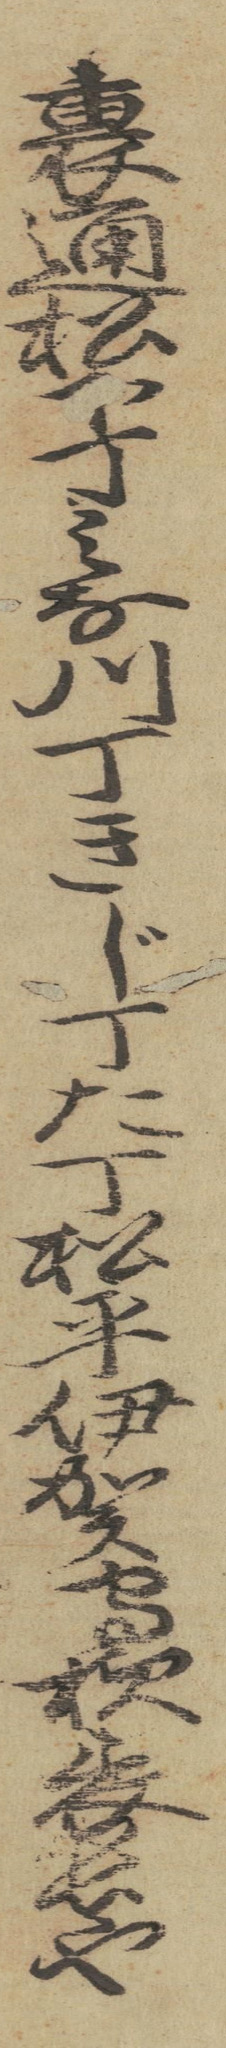裏通松丁ミな川丁きじ丁た丁松平伊賀守様裏長や
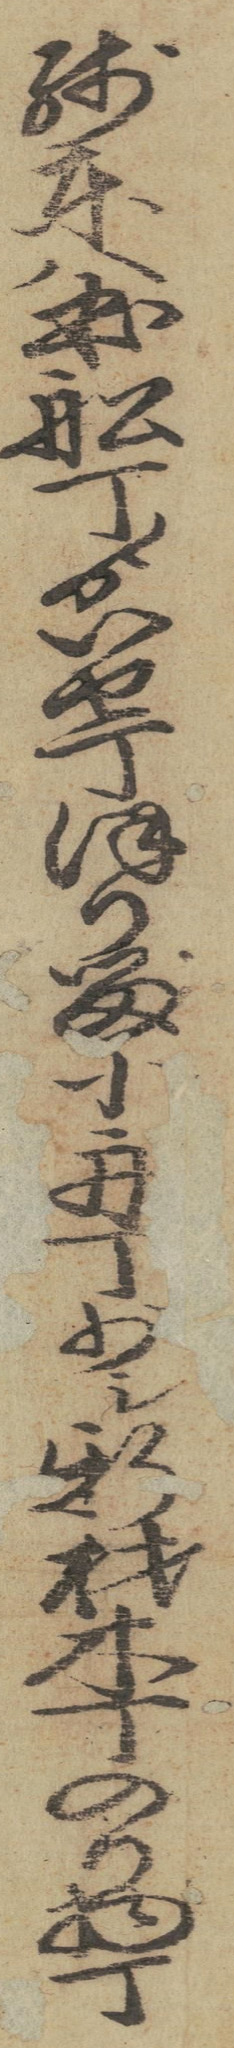残東ハ本船丁ゟいセ丁つり留小舟丁少シ新材木丁のり物丁
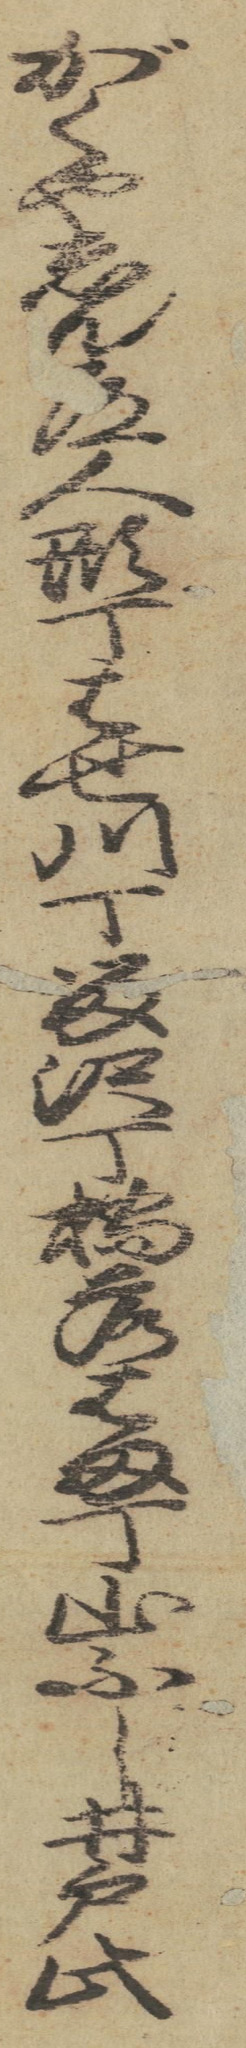がくやしん道人形丁はせ川丁長沢丁橋落はま丁山ふじ井戸此
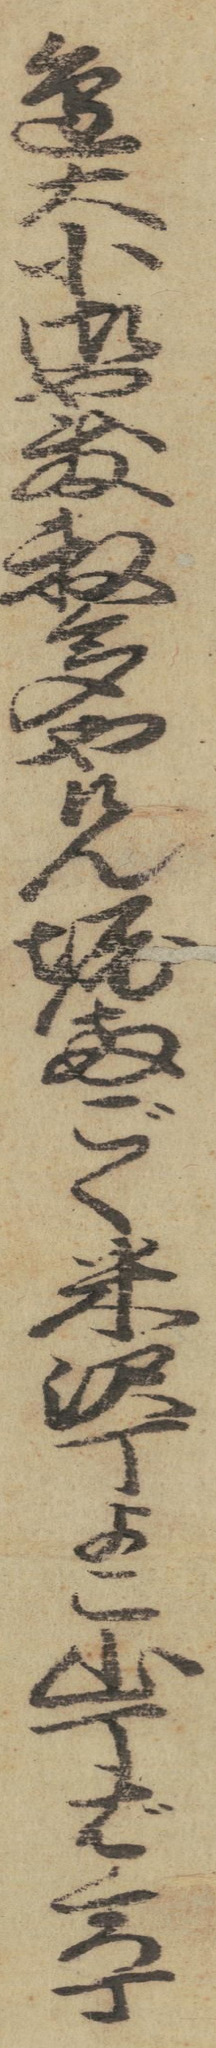邊大小御や敷数多やけん堀両国米沢丁よこ山丁ばくろ丁
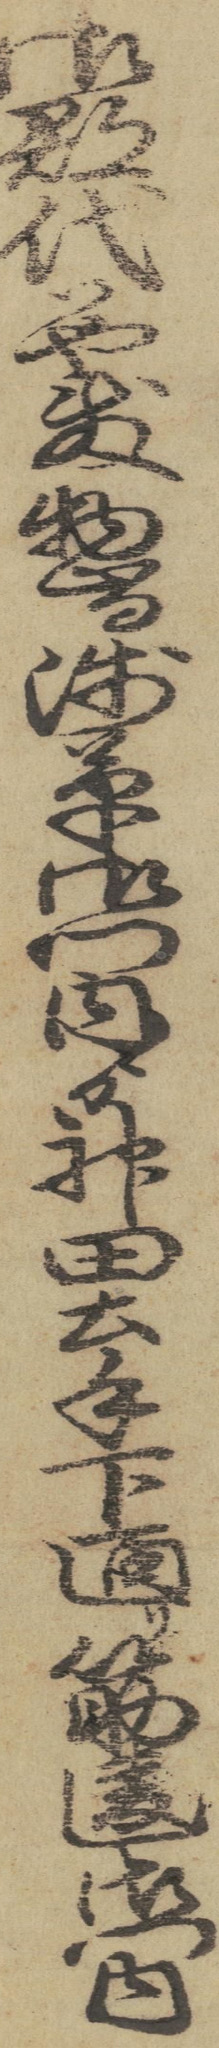御郡代や敷惣而浅草御門内ゟ神田土手下通り筋違御門内
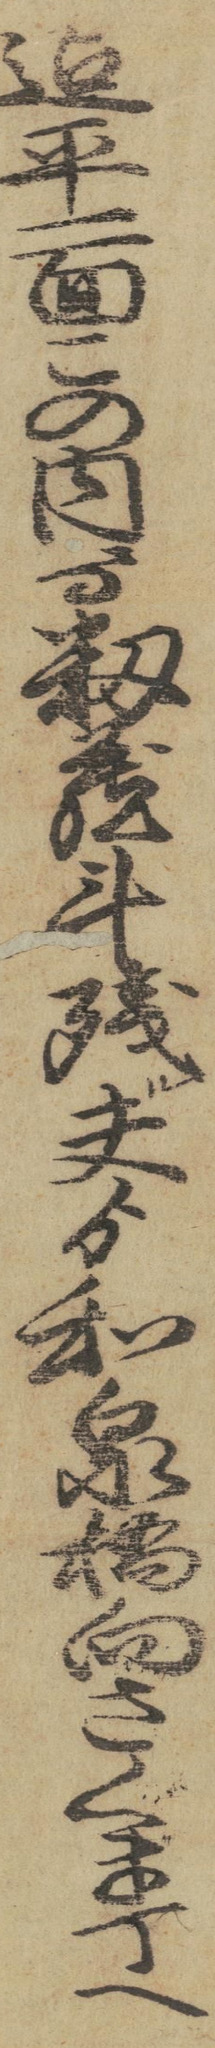迄平一面この内ニ而籾蔵斗残ル夫ゟ和泉橋向さくま丁へ
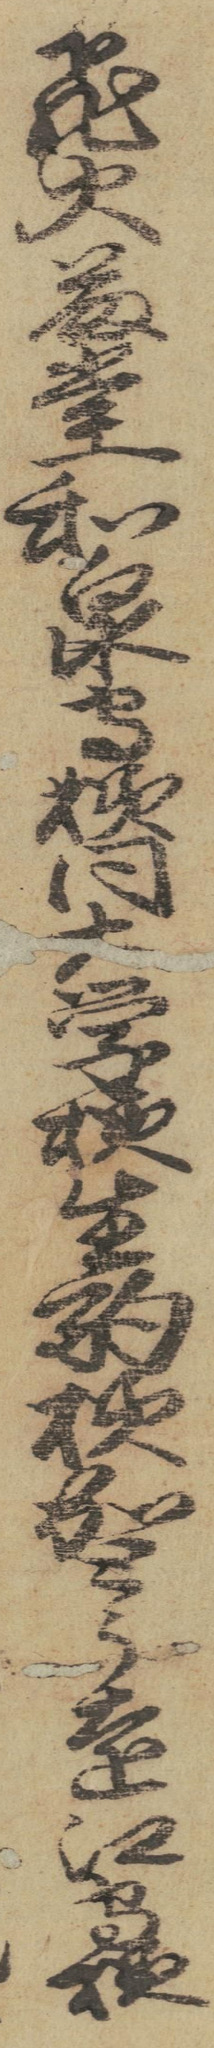飛火藤堂和泉守様同大学様生駒様加とう遠江守様
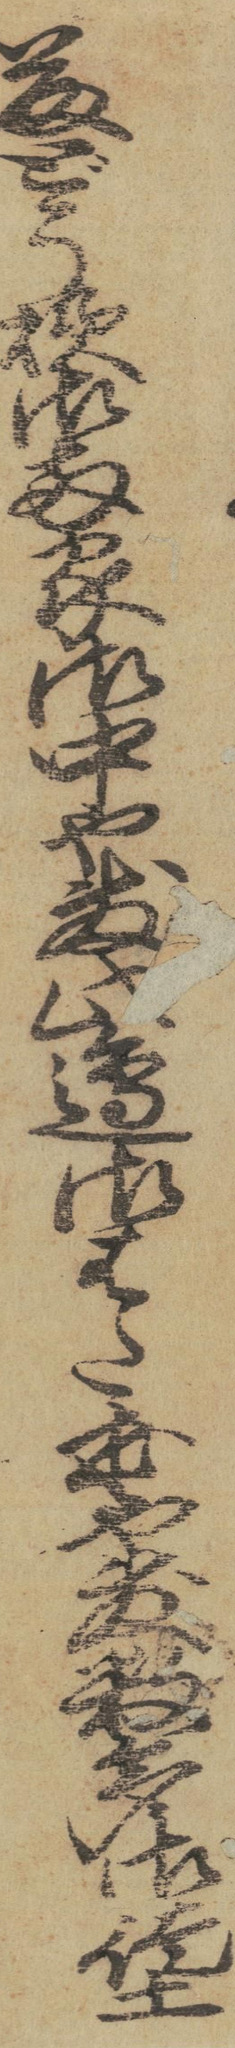藤堂様御両家御中や敷此邊御はた本や敷数多御徒士
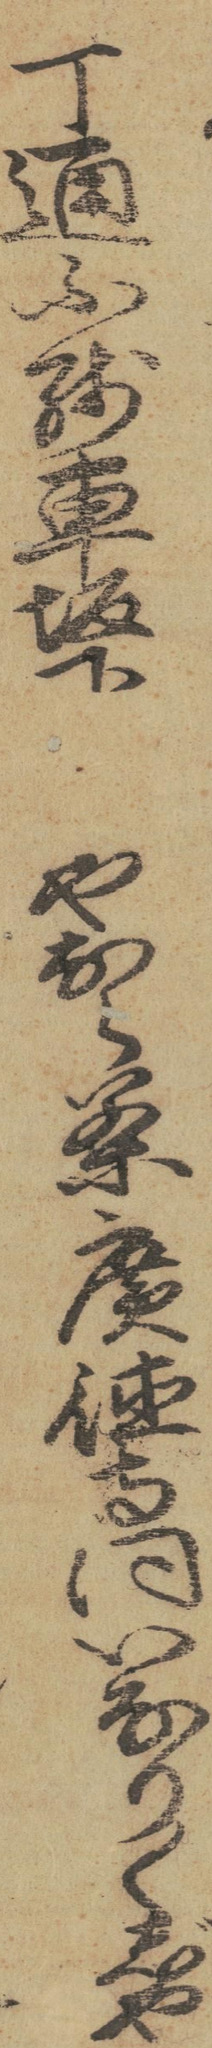丁通不残車坂下やなら茶廣徳寺同いなりくじや
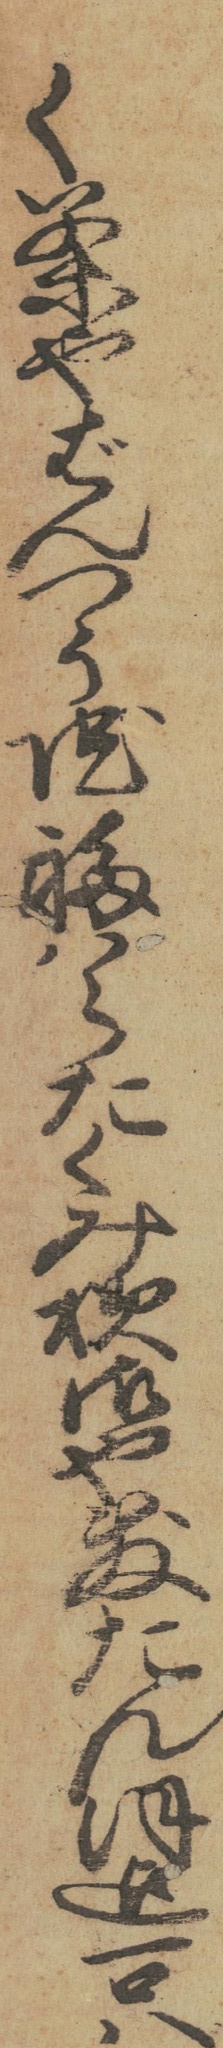く茶やばんつう院福ハらたくみ様御や敷たんほ迄一口ハ
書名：出火方角場所附
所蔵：東京大学地震研究所図書室 Earthquake Research Institute Library, The University of Tokyo, JAPAN
